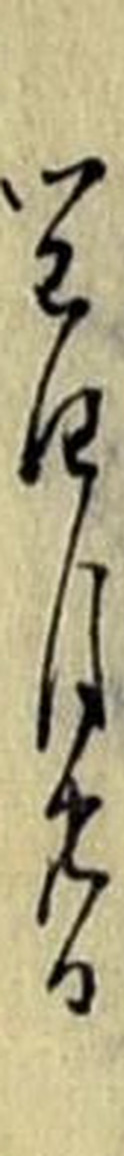閏四月廿日
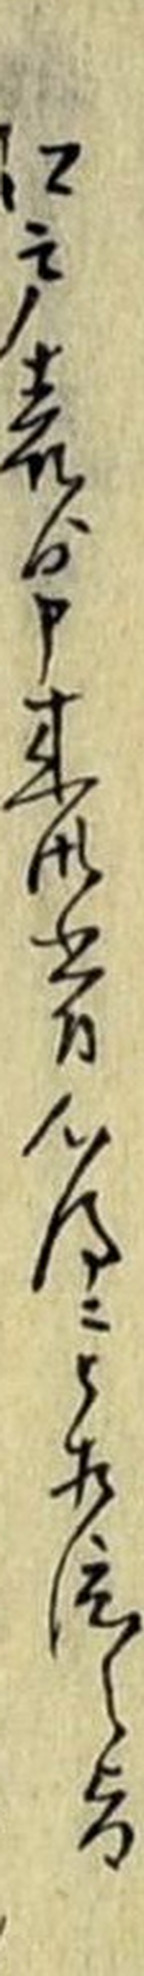江戸表ゟ申来御書付心得に被相渡旨
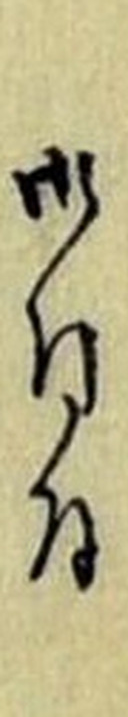御目付
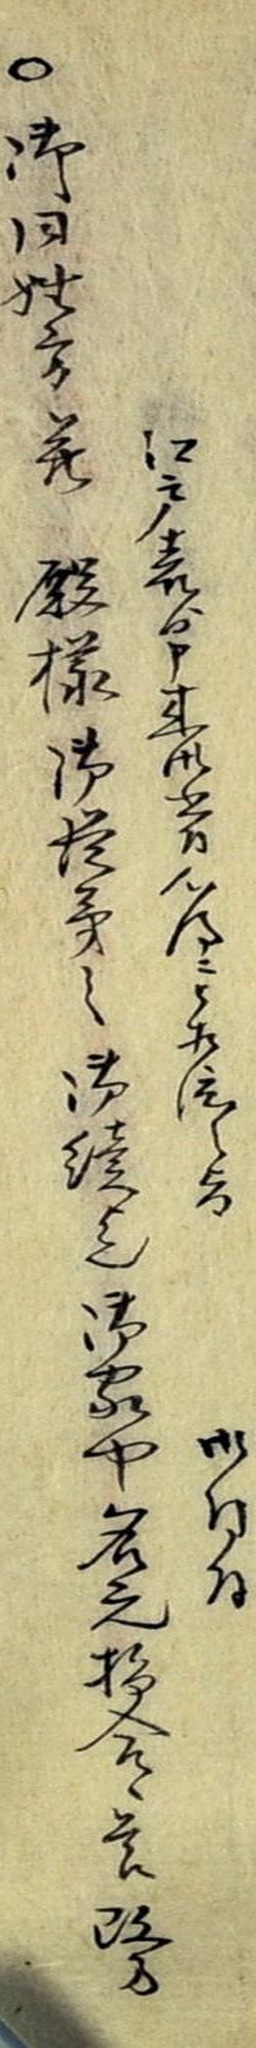○御同姓方并殿様御従弟之御続柄迄御家中名元指合候節改方
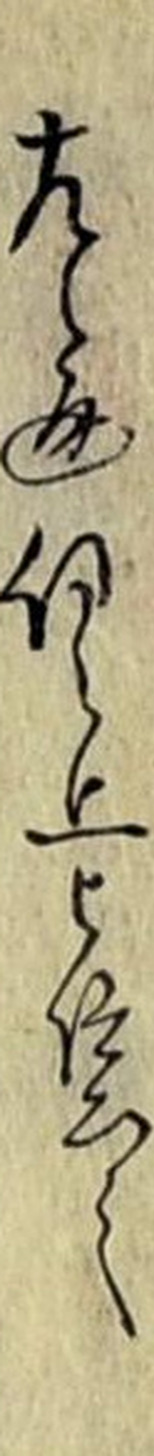左之通伺之上被仰出候
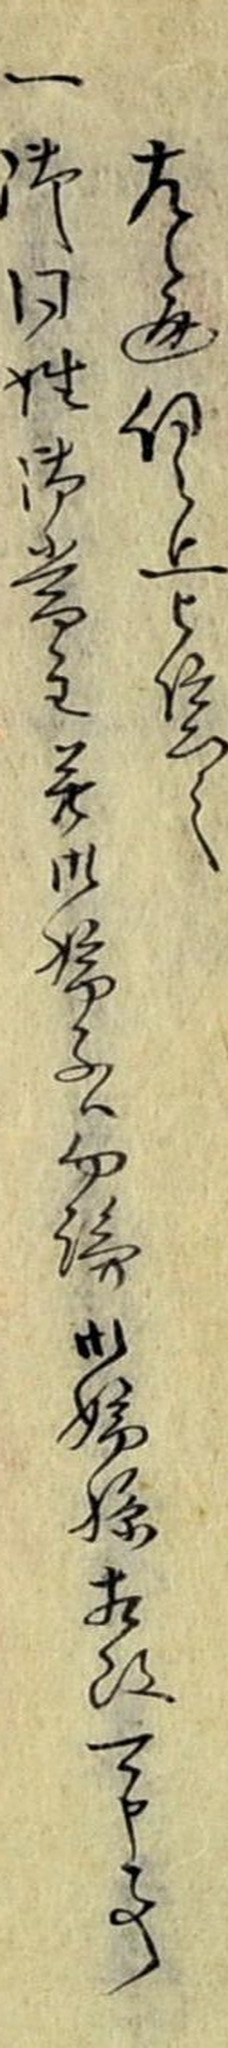一御同姓御当主并御嫡子は勿論御嫡孫相改可申事
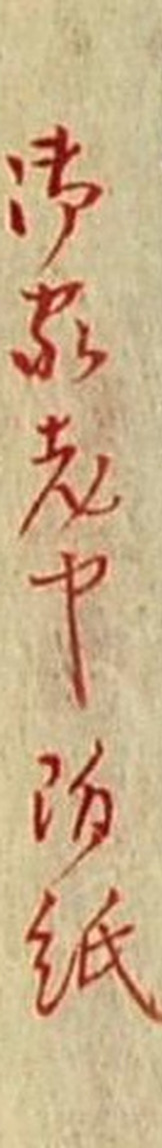御家老中附紙
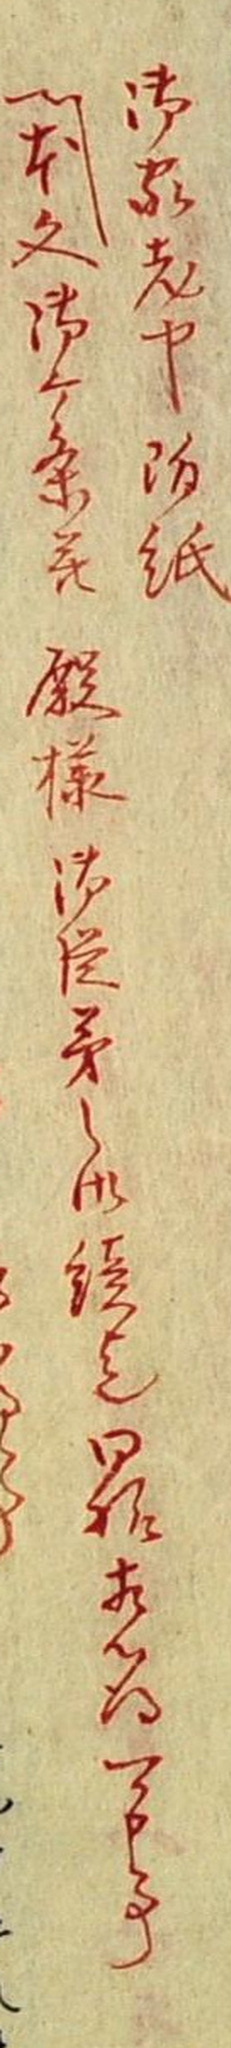「本文御ヶ条并殿様御従弟の御続迄同様相心得可申事
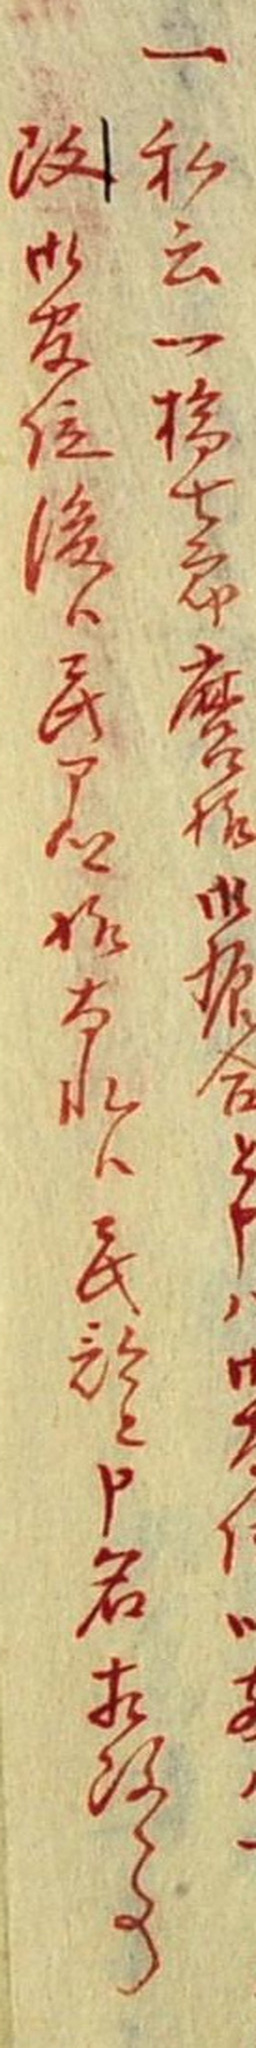改御官位後は民部卿様太礼は民部と申名相改候事

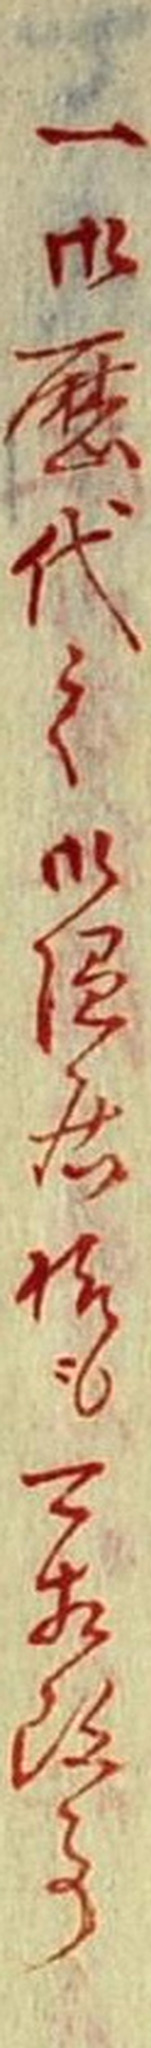一御歴代之御隠居様も可相改事
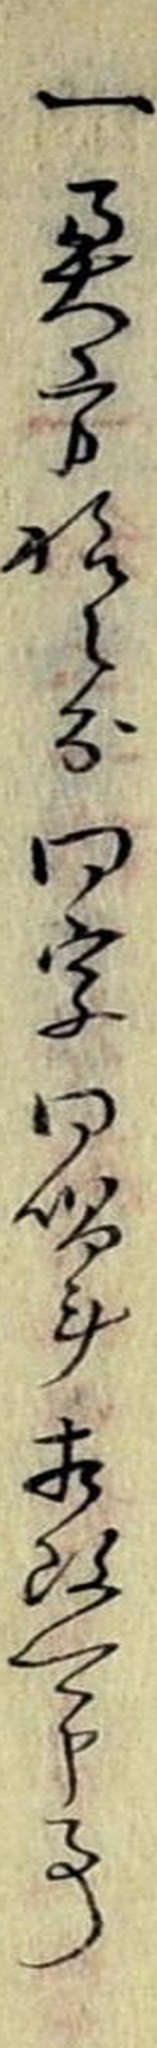一奥方様之分同字同唱斗相改可申事
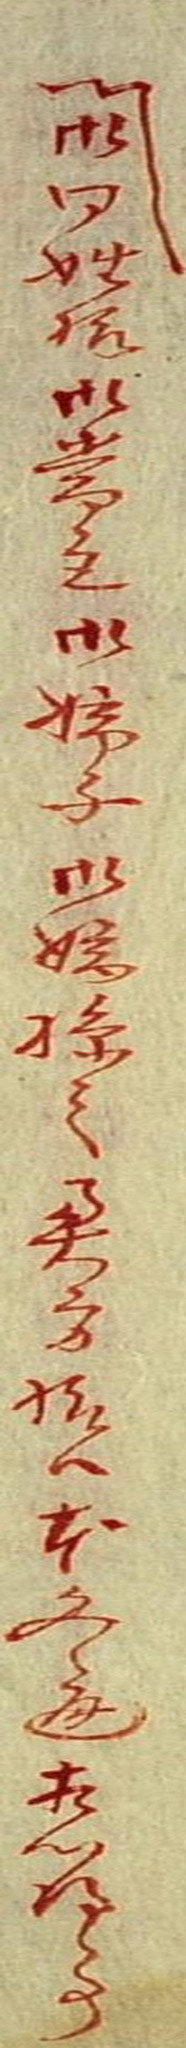「御同姓様御当主御嫡子御嫡孫之奥方様は本文之通相心得候事
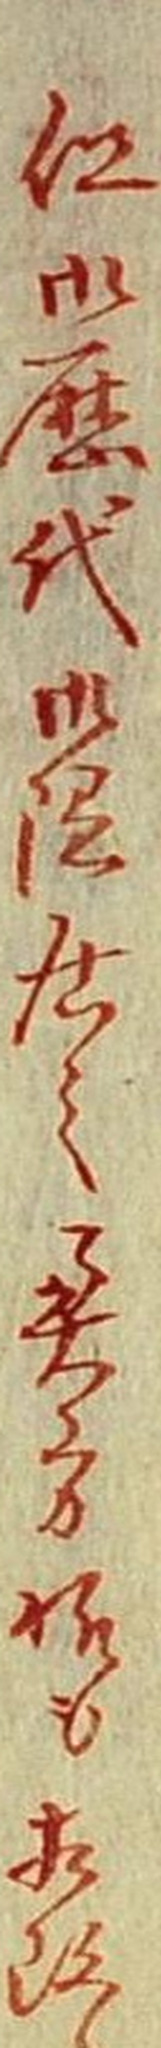但御歴代御隠居之奥方様も相改候事
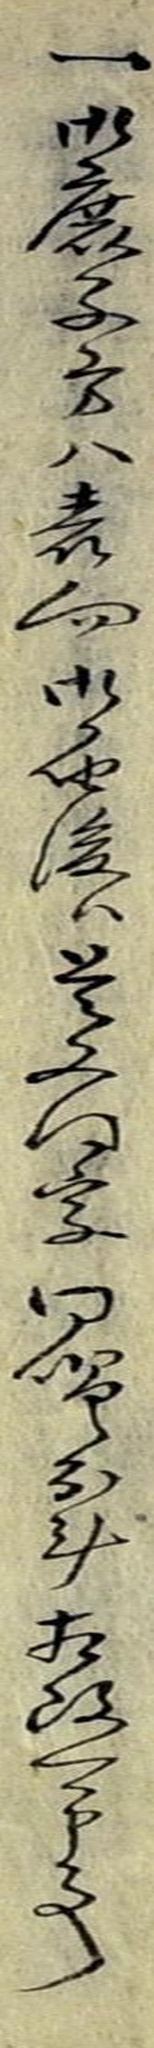一御庶子方は表向御届後は是又同字同唱之分斗相改可申事
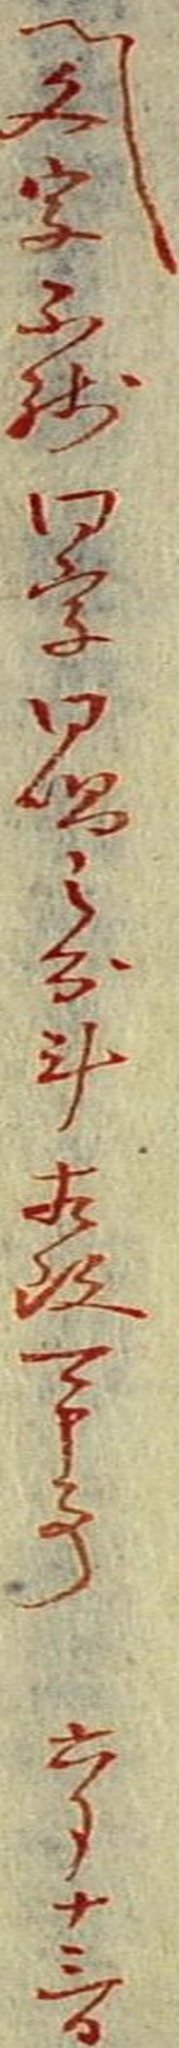「各字不残同字同唱之分斗相改可申事六月十三日
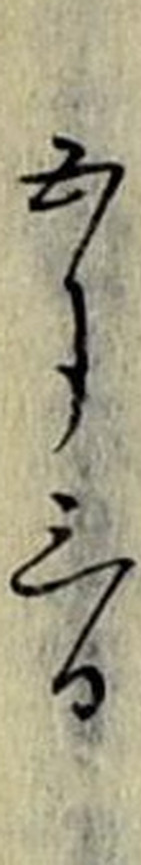五月三日
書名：命令之部 六
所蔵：福井県文書館 Fukui Prefectural Archives
